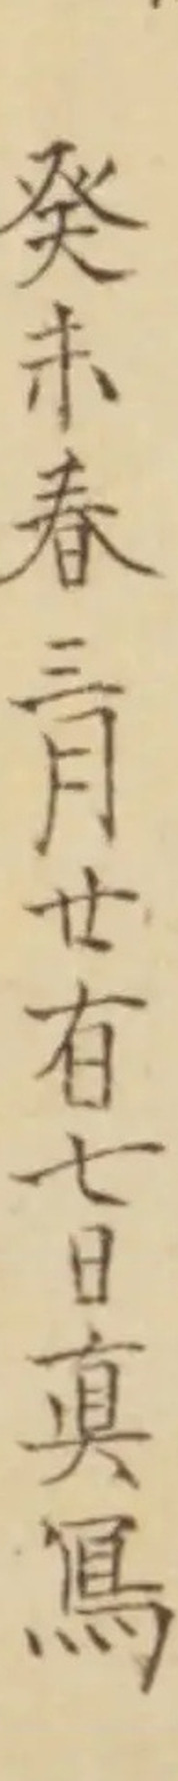癸未春三月廿有七日真写

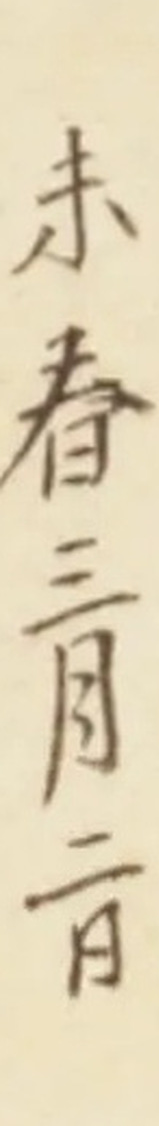未春三月二日
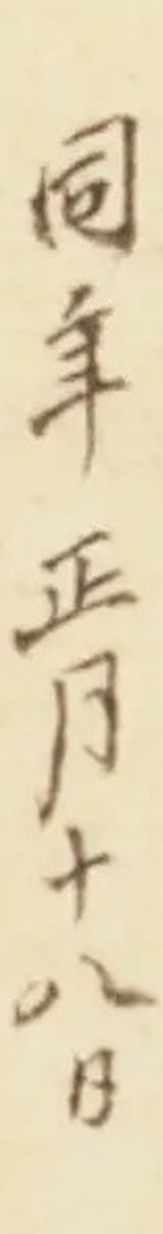同年正月十八日
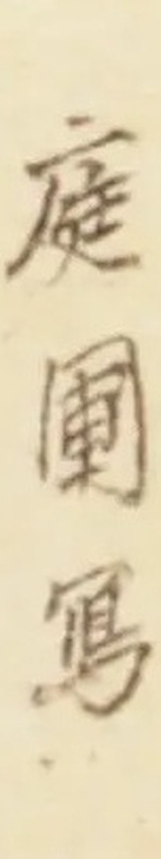庭園写
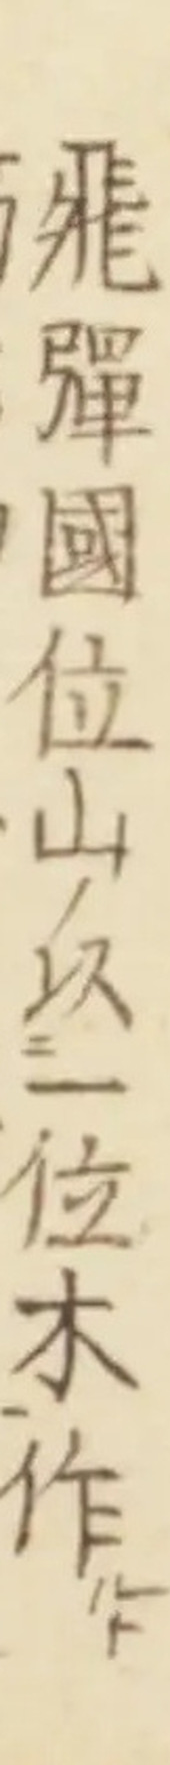飛騨国位山以一位木作
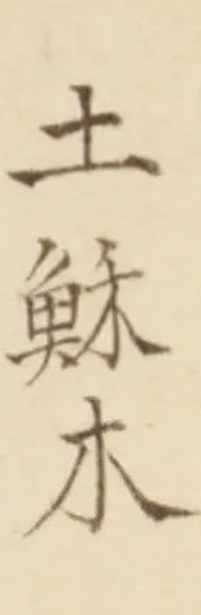土穌木
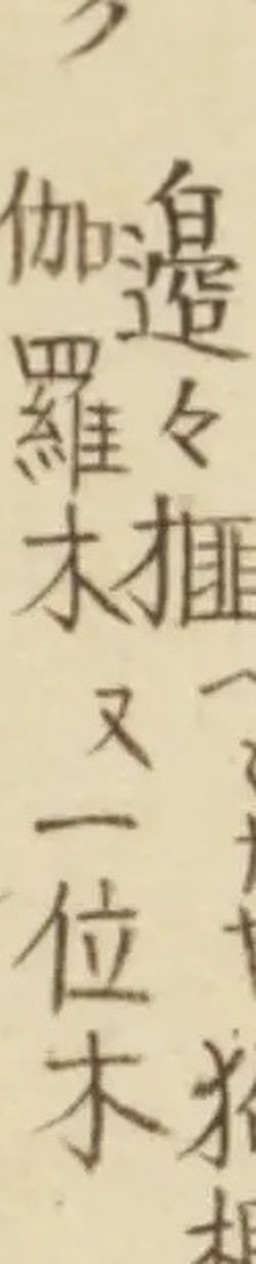伽羅木又一位木
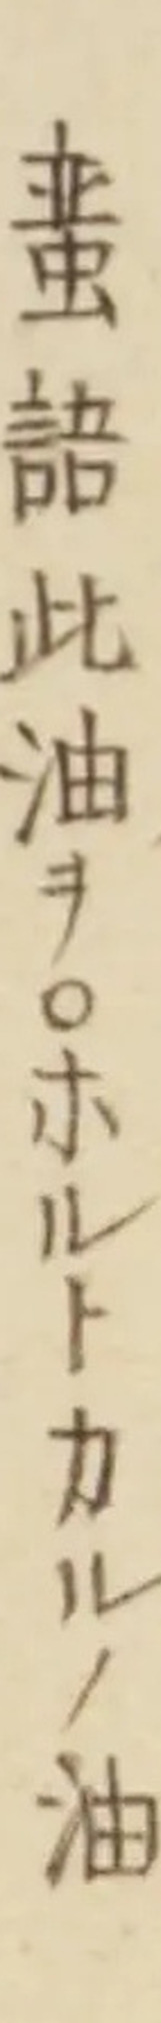蛮語此油ヲ◦ホルトカルノ油
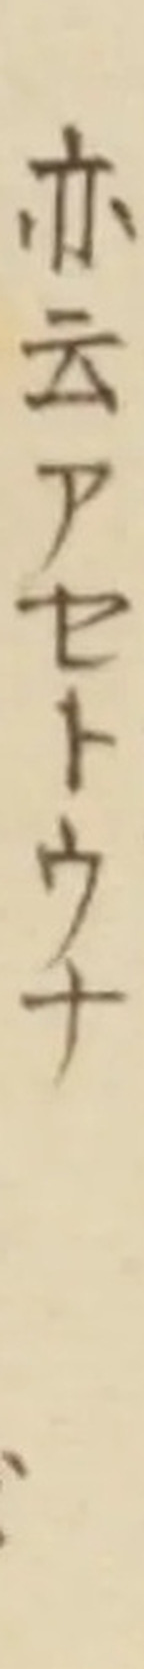亦云アセトウナ
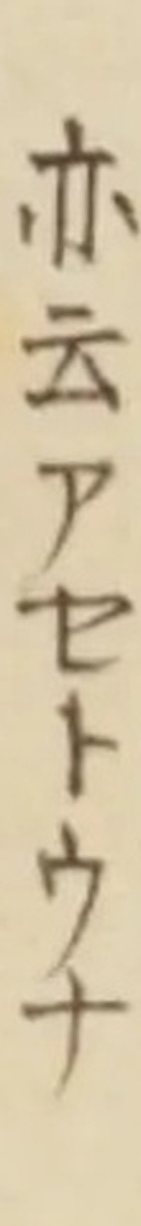亦云アセトウナ
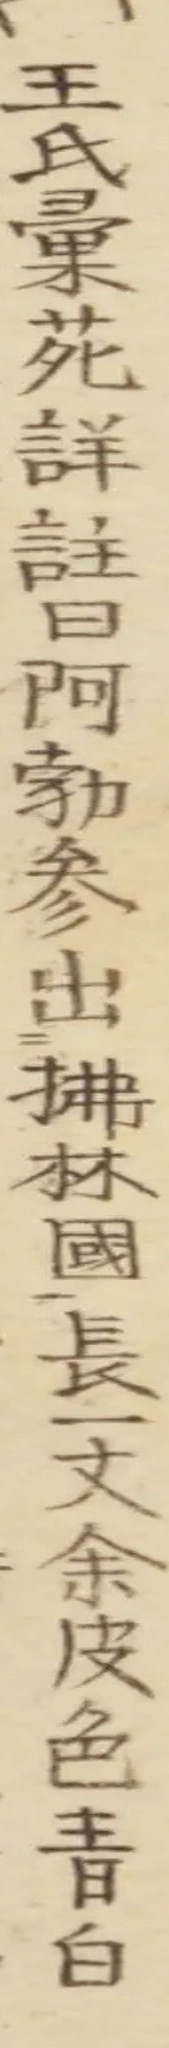王氏彙苑詳注曰阿勃参出払林国長一丈余皮色青白
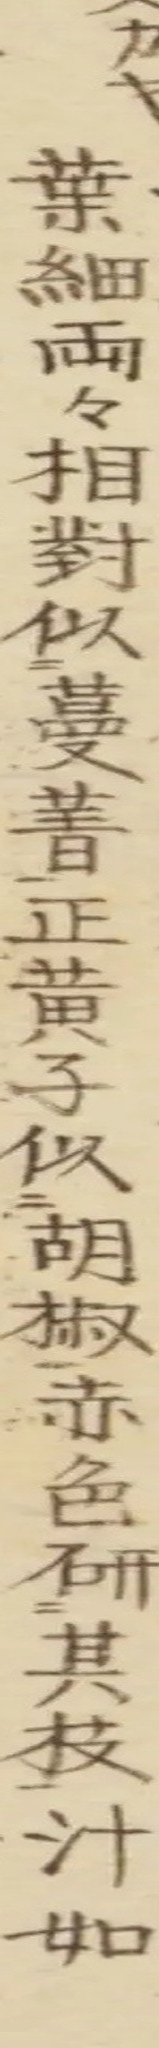葉細両々相対似蔓菁正黄子似胡椒赤色研其枝汁如
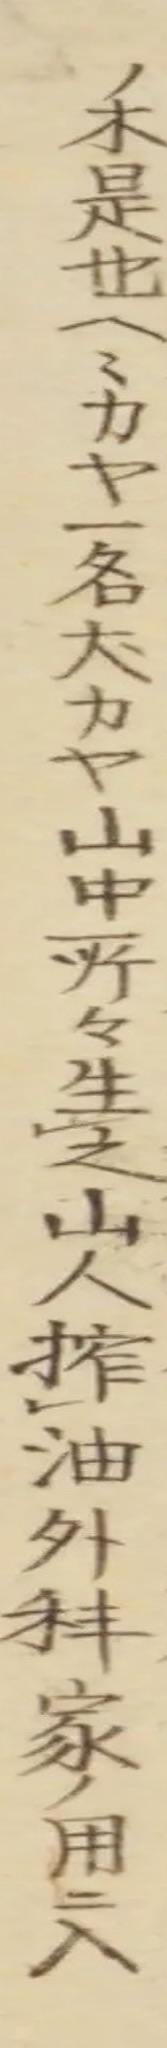ノ木是也ベヽカヤ一名犬カヤ山中所々生之山人搾油外科家ノ用ニ入

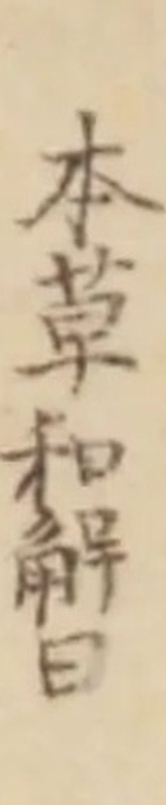本草和解曰
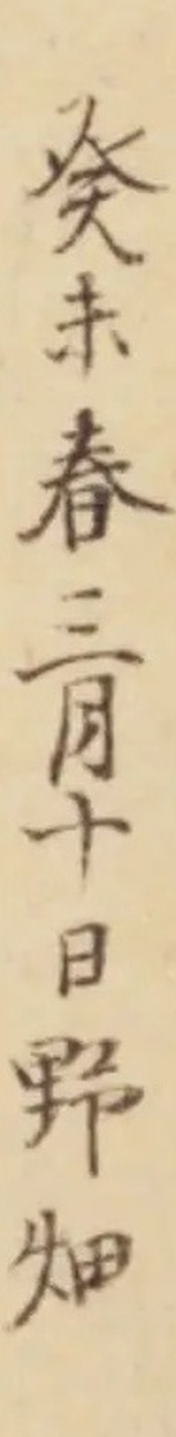癸未春三月十日野畑
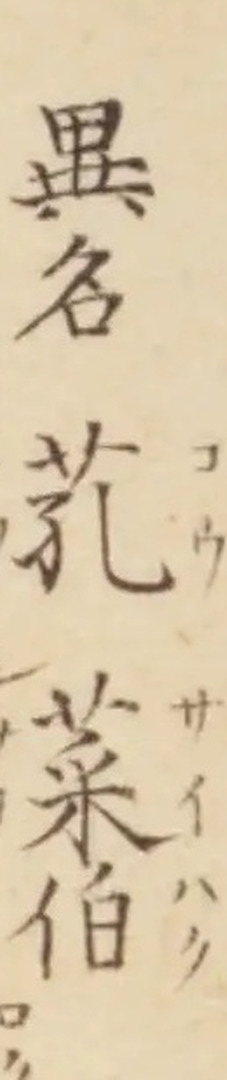異名芤菜伯
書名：梅園草木花譜春之部. 1
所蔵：国立国会図書館 National Diet Library, JAPAN
